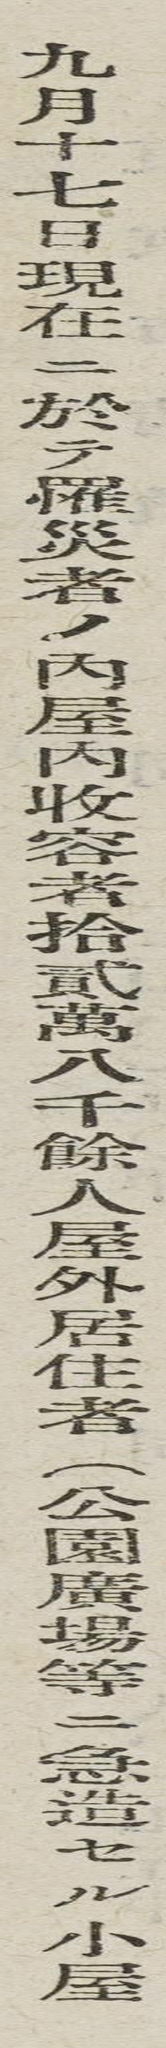九月十七日現在ニ於テ罹災者ノ内屋内収容者拾弐万八千余人屋外居住者（公園広場等ニ急造セル小屋
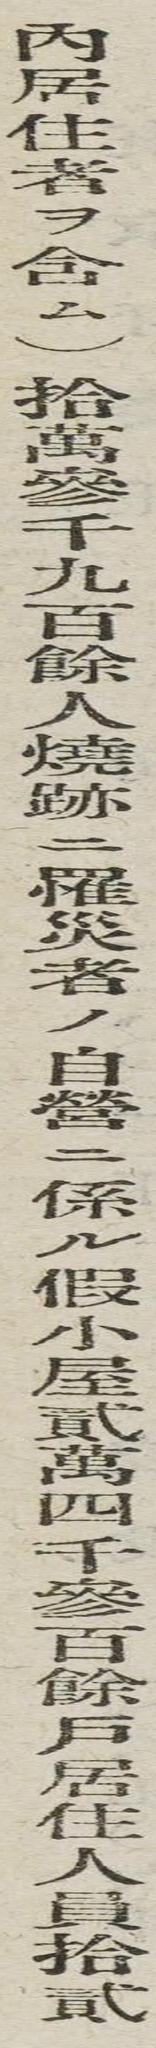内居住者ヲ含ム）拾万参千九百余人焼跡ニ罹災者ノ自営ニ係ル仮小屋弐万四千参百余戸居住人員拾弐
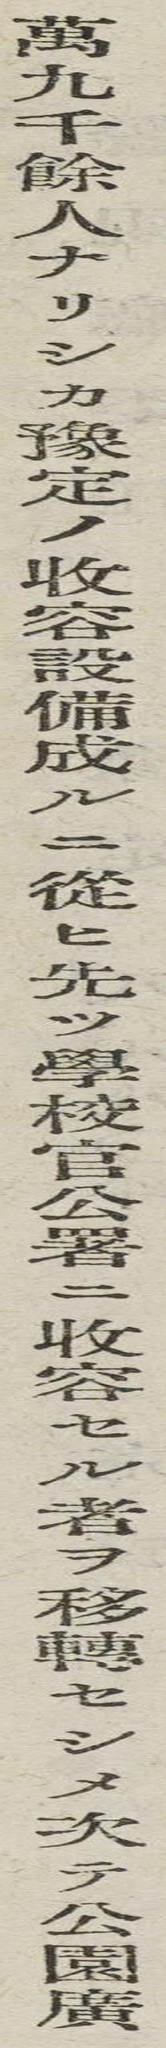万九千余人ナリシカ予定ノ収容設備成ルニ従ヒ先ツ学校官公署ニ収容セル者ヲ移転セシメ次テ公園広
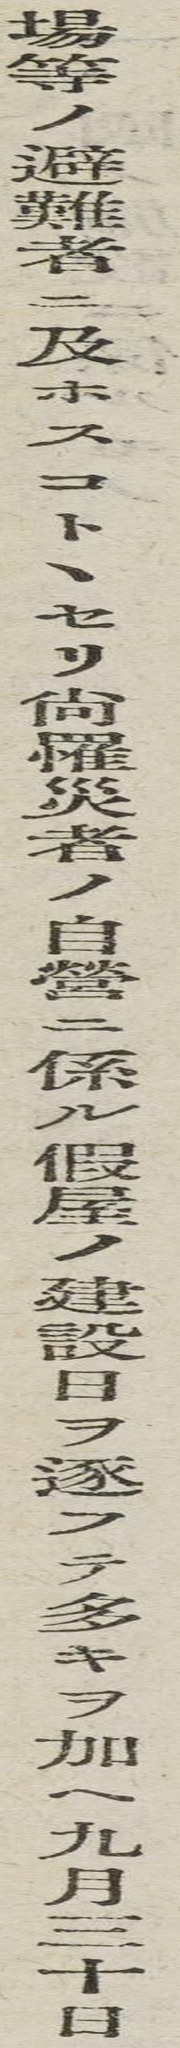場等ノ避難者ニ及ホスコトヽセリ尚罹災者ノ自営ニ係ル仮屋ノ建設日ヲ遂フテ多キヲ加ヘ九月三十日
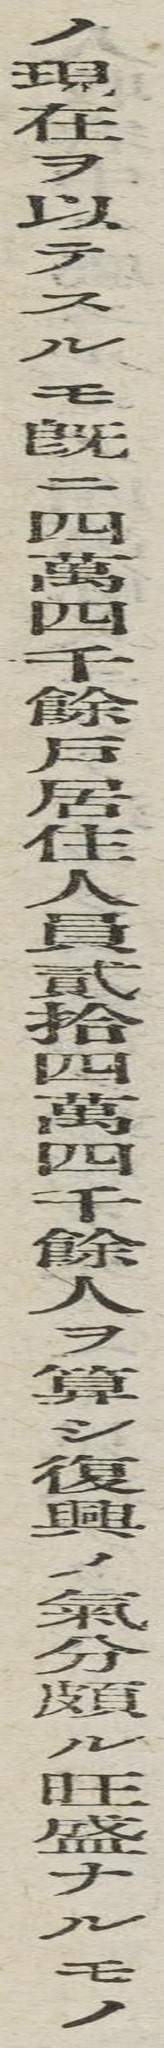ノ現在ヲ以テスルモ既ニ四万四千余戸居住人員弐拾四万四千余人ヲ算シ復興ノ気分頗ル旺盛ナルモノ
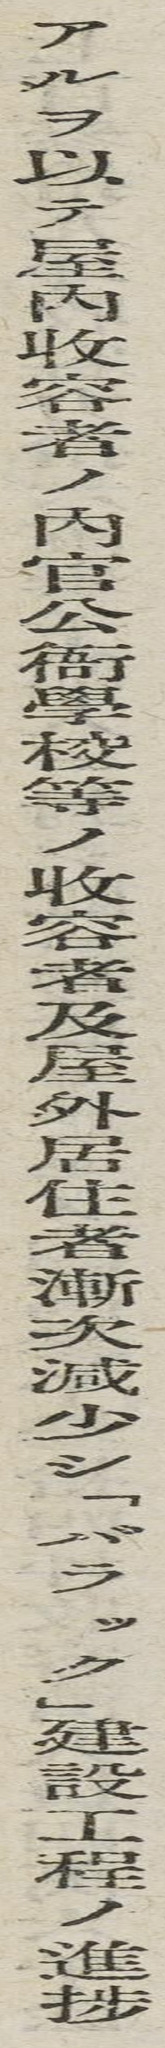アルヲ以テ屋内収容者ノ内官公衙学校等ノ収容者及屋外居住者漸次減少シ「バラック」建設工程ノ進捗
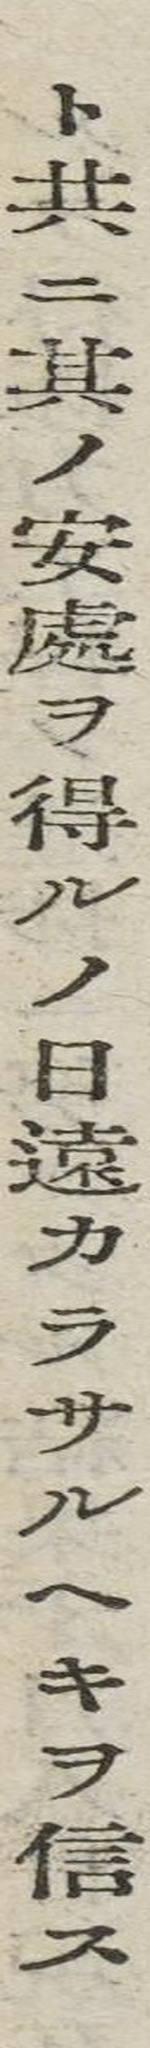ト共ニ其ノ安処ヲ得ルノ日遠カラサルヘキヲ信ス
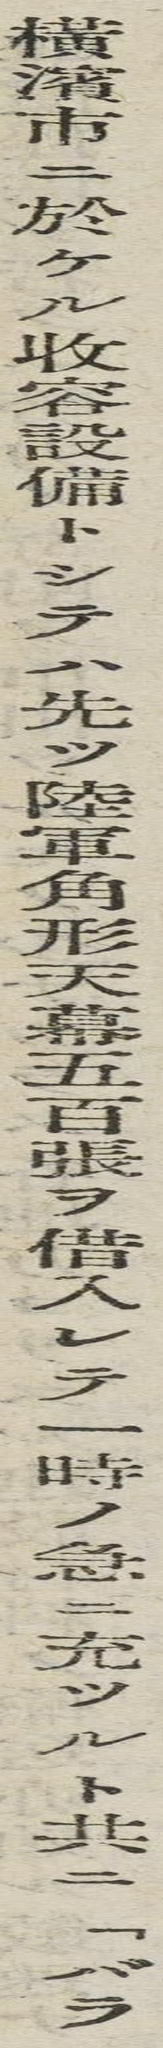横浜市ニ於ケル収容設備トシテハ先ツ陸軍角形天幕五百張ヲ借入レテ一時ノ急ニ充ツルト共ニ「バラ
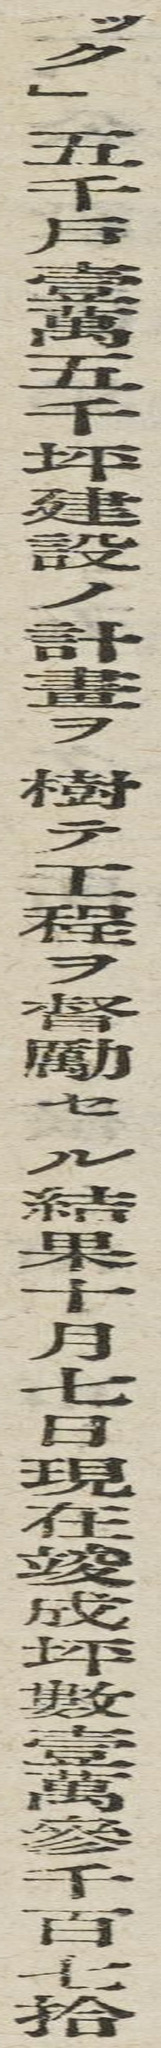ック」五千戸壱万五千坪建設ノ計画を樹テ工程ヲ督励セル結果十月七日現在竣成坪数壱万参千百七拾
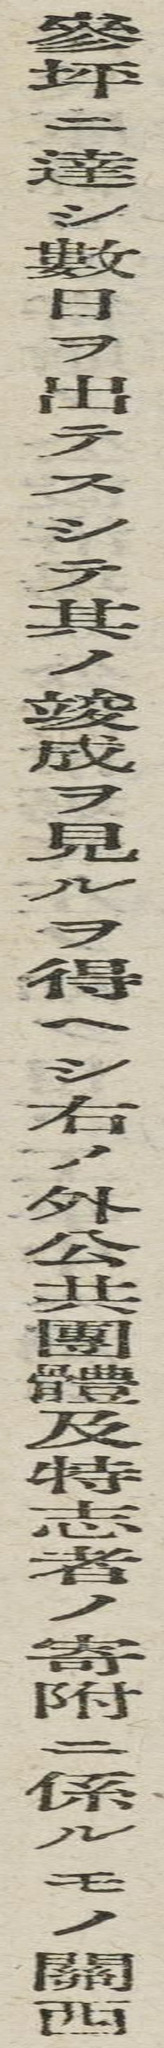参坪ニ達シ数日ヲ出テスシテ其ノ竣成ヲ見ルヲ得ヘシ右ノ外公共団体及特志者ノ寄附ニ係ルモノ関西
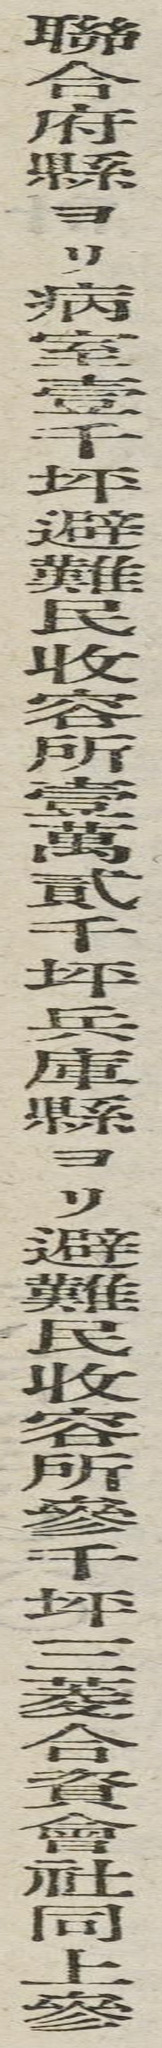連合府県ヨリ病室壱千坪避難民収容所壱万弐千坪兵庫県ヨリ避難民収容所参千坪三菱合資会社同上参
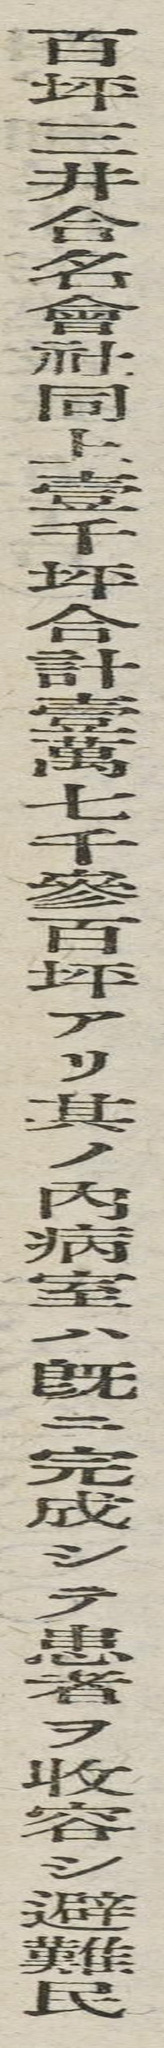百坪三井合名会社同上壱千坪合計壱万七千参百坪アリ其ノ内病室ハ既ニ完成シテ患者ヲ収容シ避難民
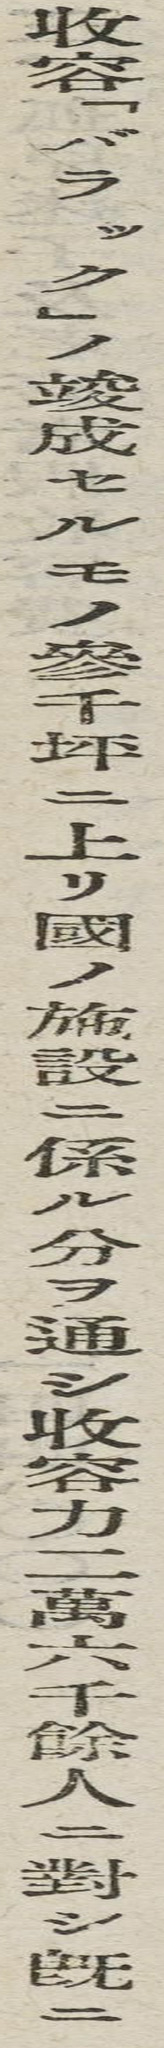収容「バラック」ノ竣成セルモノ参千坪ニ上リ国ノ施設ニ係ル分ヲ通シ収容力二万六千余人ニ対シ既ニ
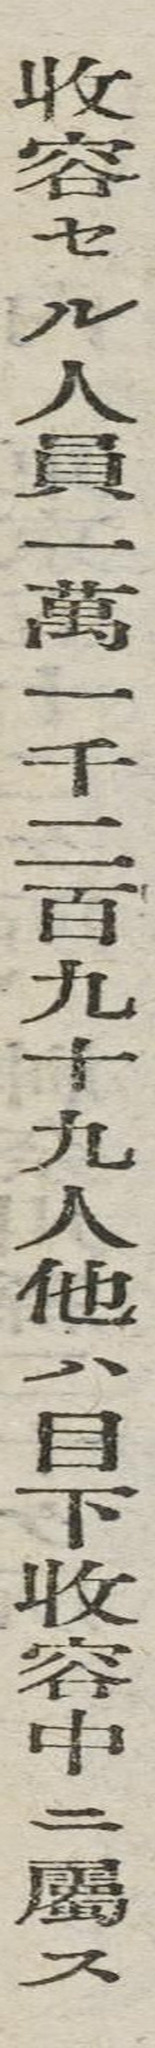収容セル人員一万一千二百九十九人他ハ目下収容中ニ属ス
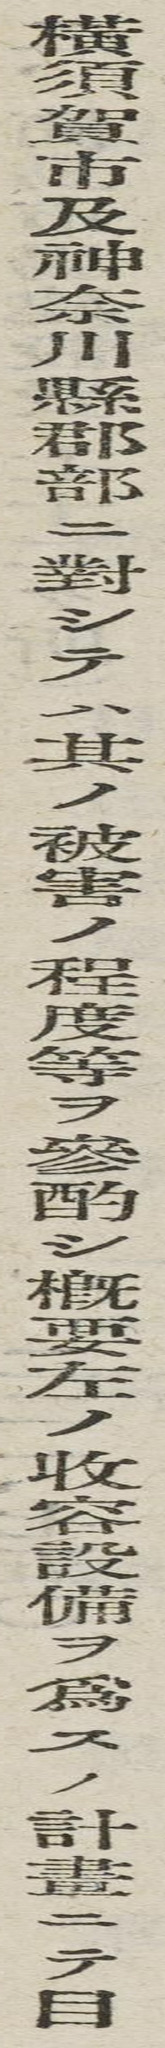横須賀市及神奈川県郡部ニ対シテハ其ノ被害ノ程度等ヲ参酌シ概要左ノ収容設備ヲ為スノ計画ニテ目
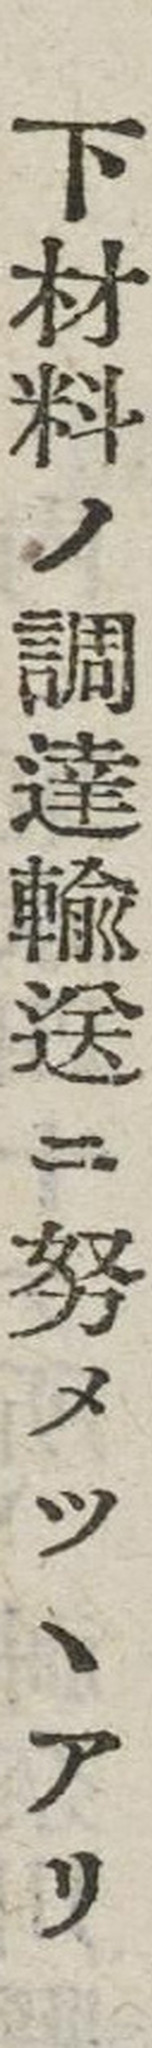下材料ノ調達輸送ニ努メツヽアリ
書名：震災被害状況並救護施設概要
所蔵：東京大学地震研究所図書室 Earthquake Research Institute Library, The University of Tokyo, JAPAN
